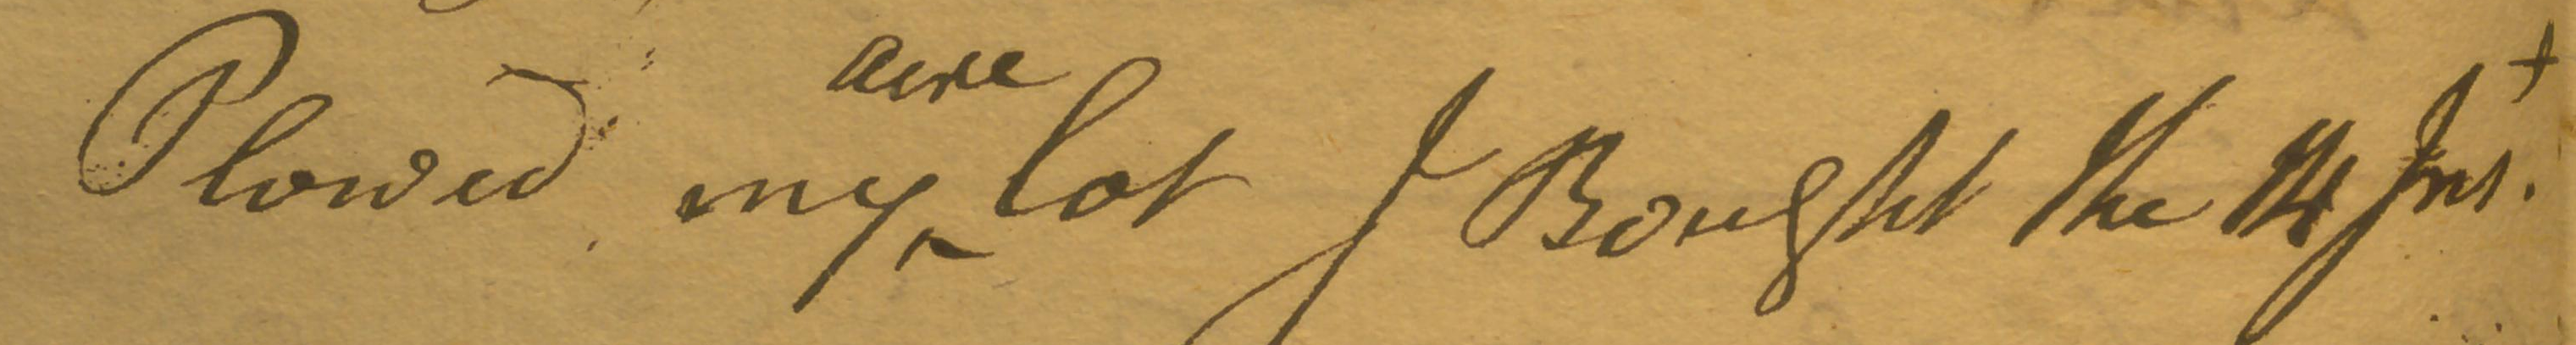Plowed my ^ lot I Bought the 14 Ins^t.
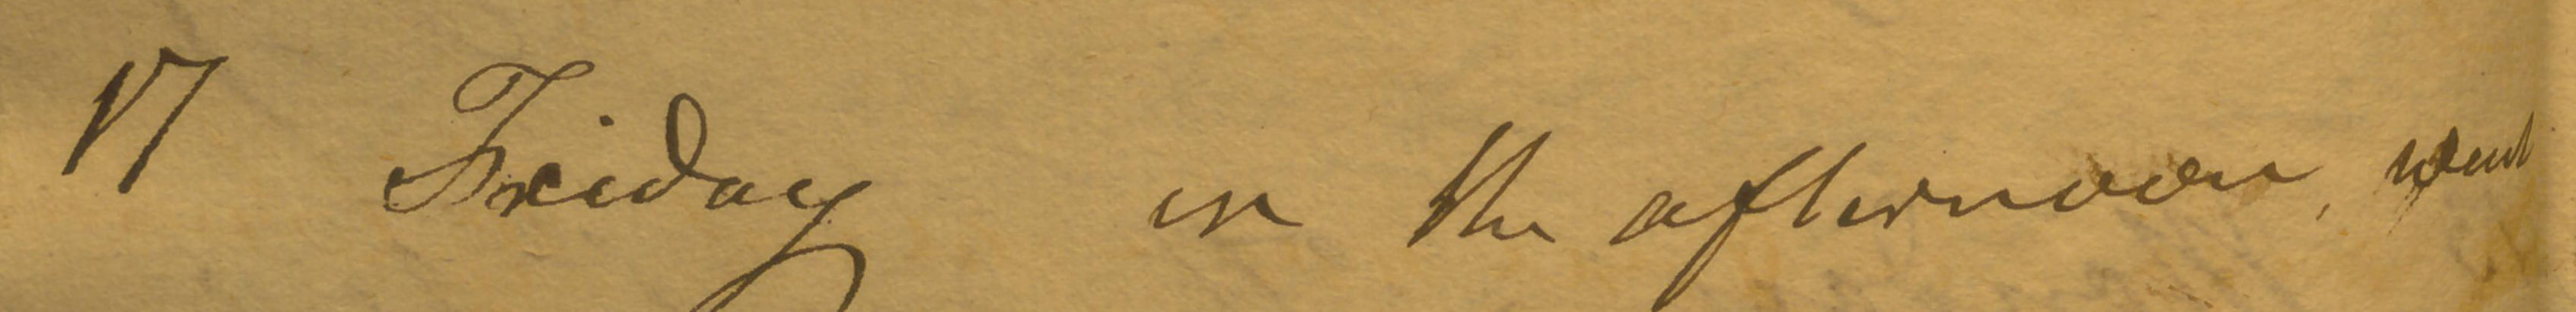11 Friday in the afternoon, went
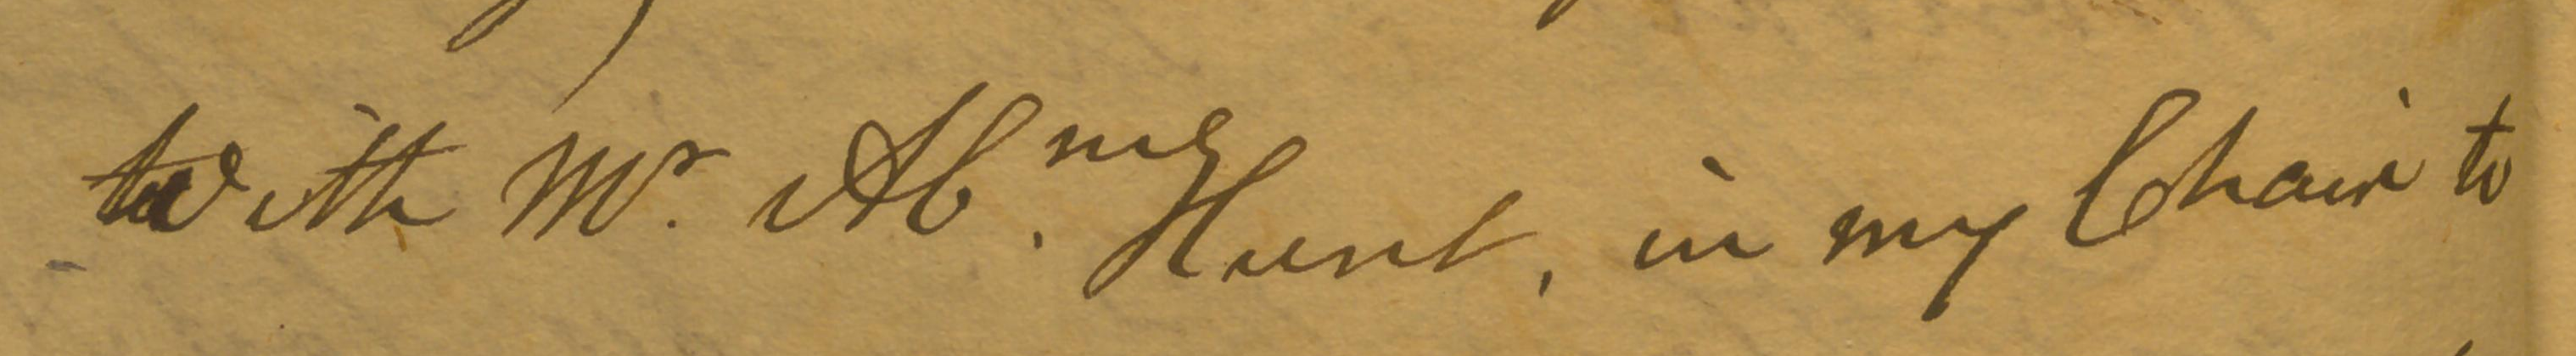with M^r. Ab^m. Hunt, in my Chair to
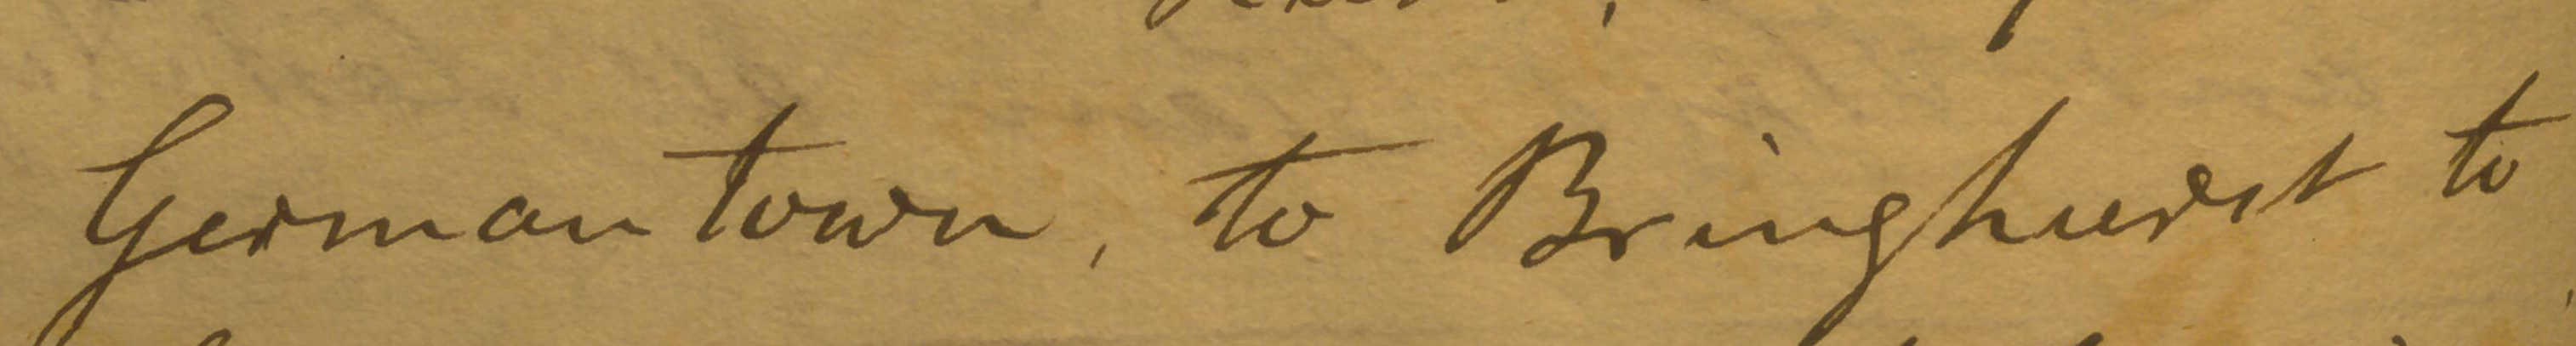Germantown, to Bringhierst to
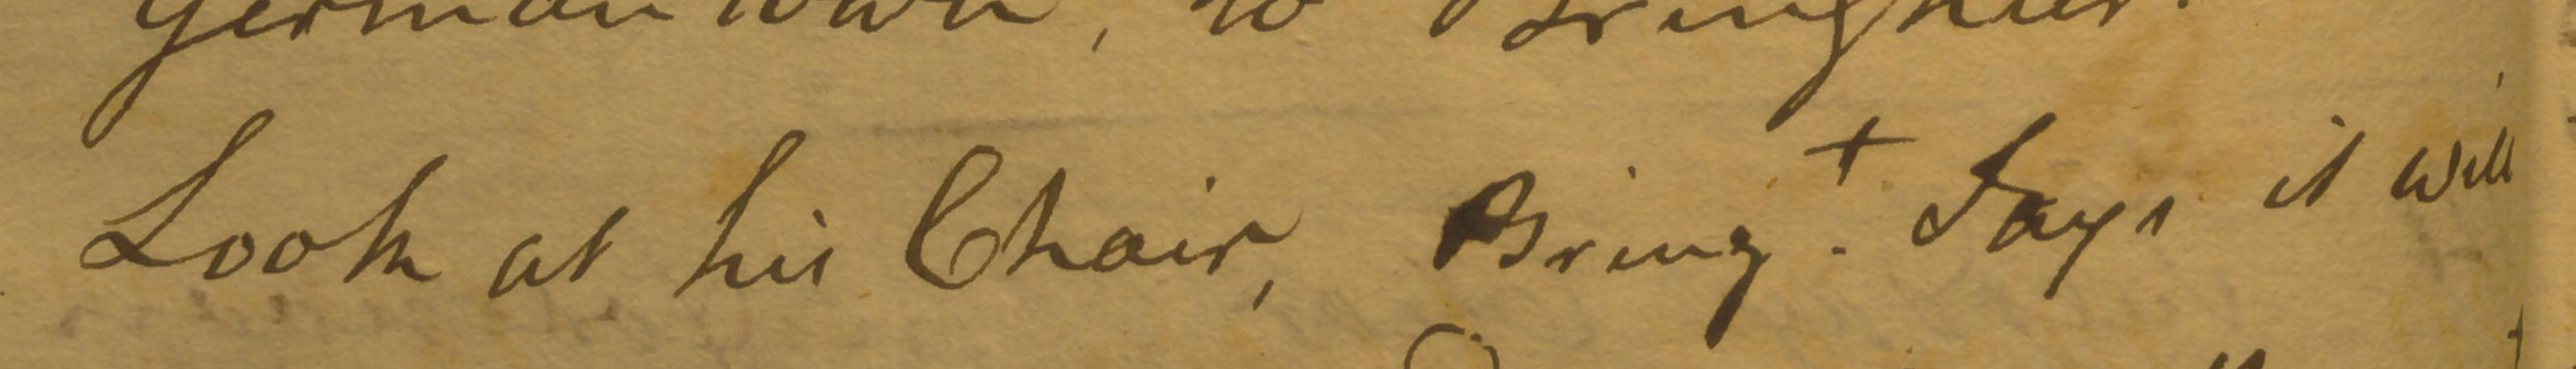Look at his Chair Bring^t. Says it will
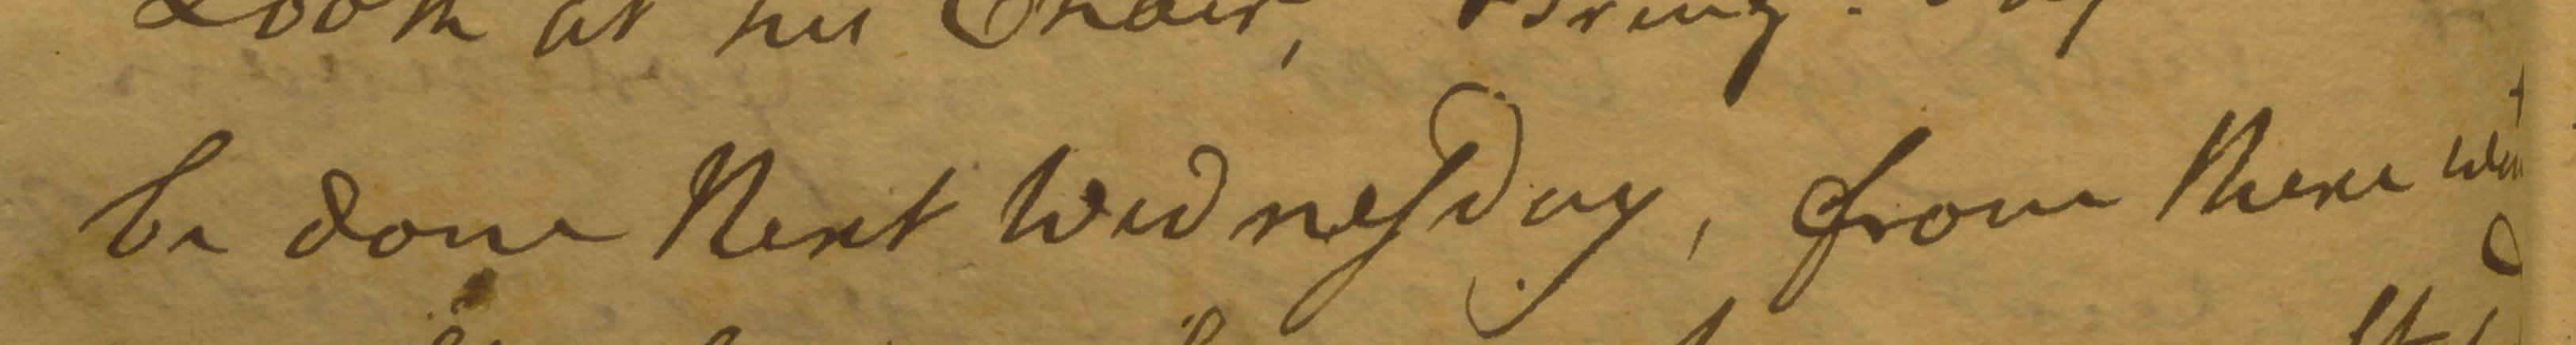be done Next Widnesday, from there went
